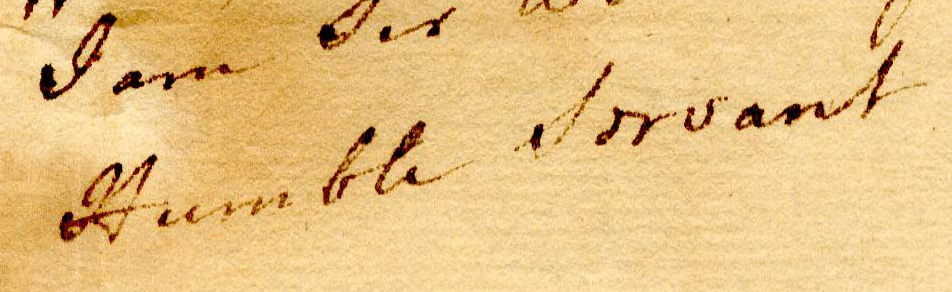Humble Servant
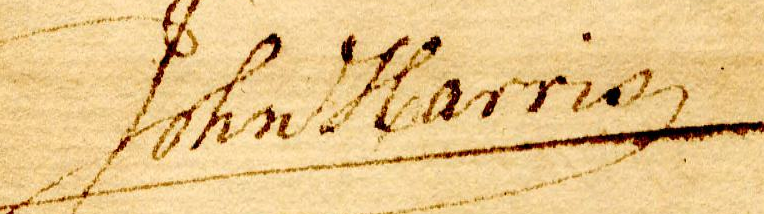John Harris
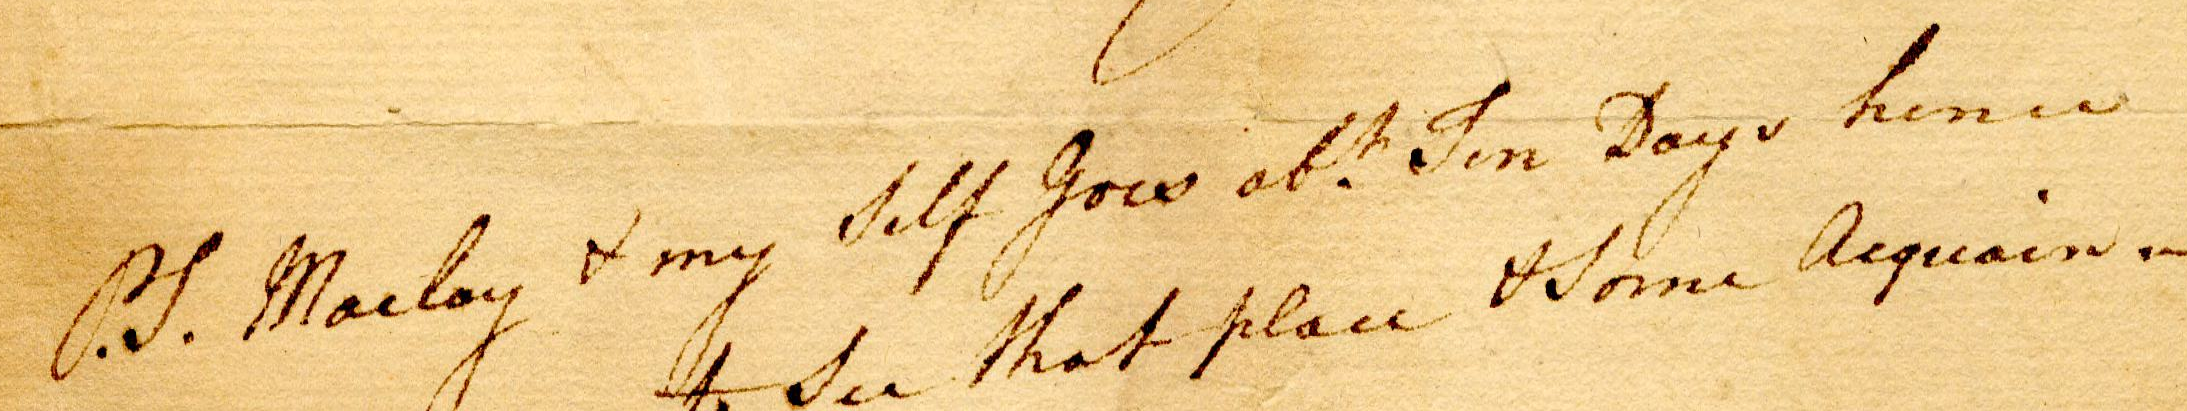P.S. Maclay & my self goes ab^t. Ten Days hence
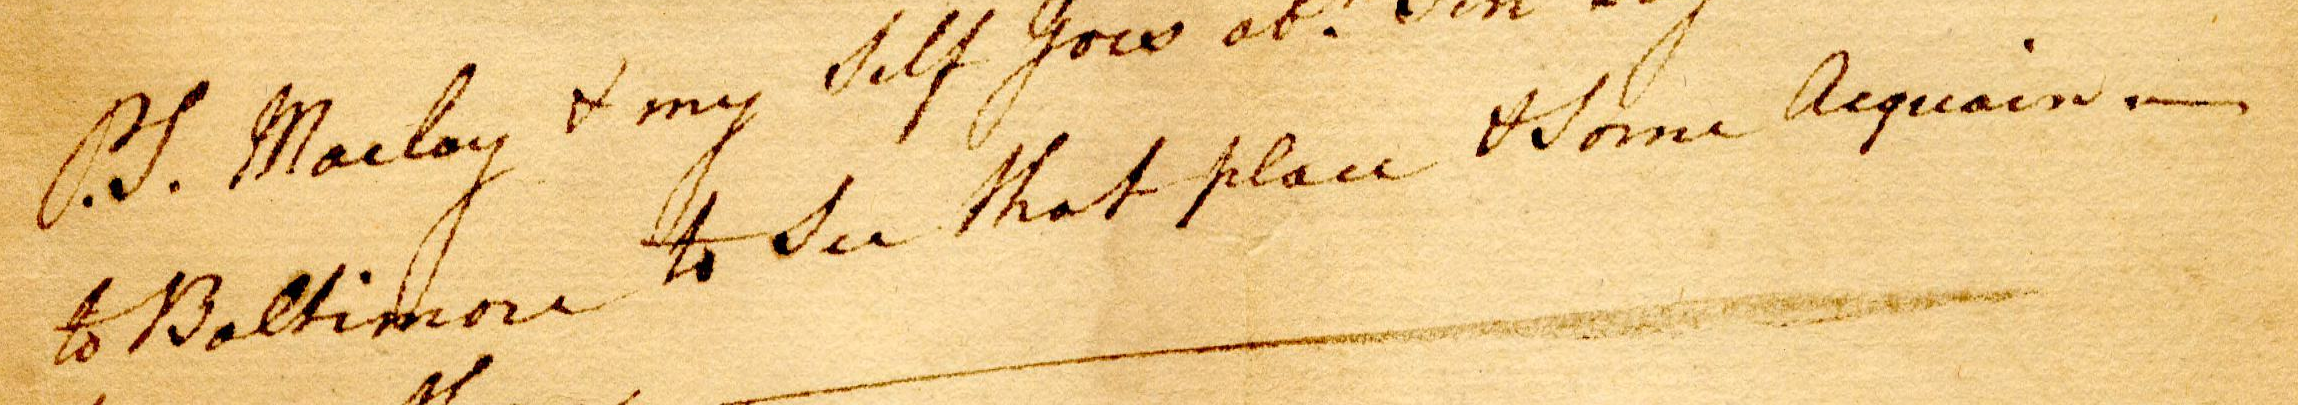to Baltimore to see that place & some Acquain-
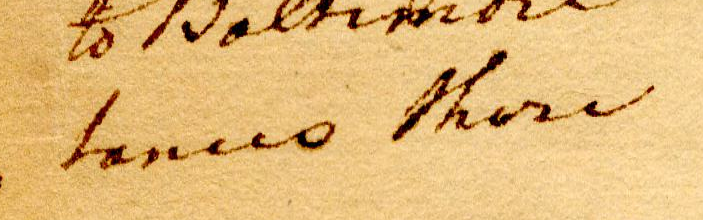tances there
